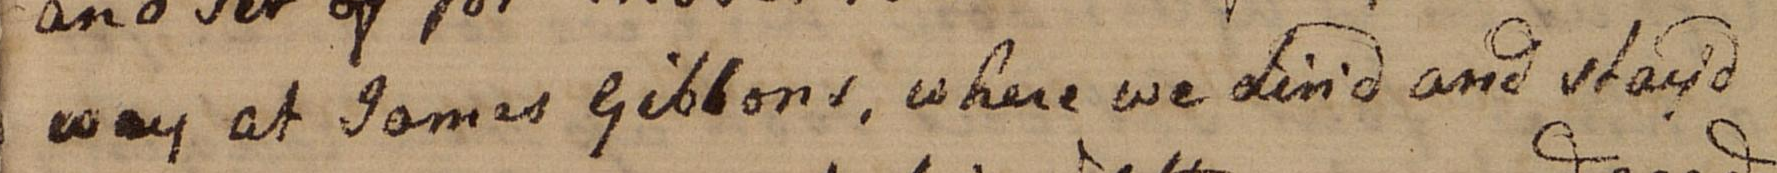way at James Giblons, where we din'd and stay'd
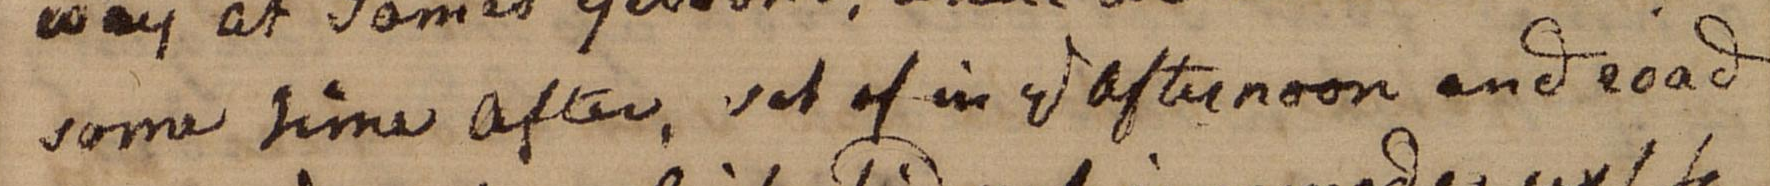some time after, set of in y^e afternoon and road
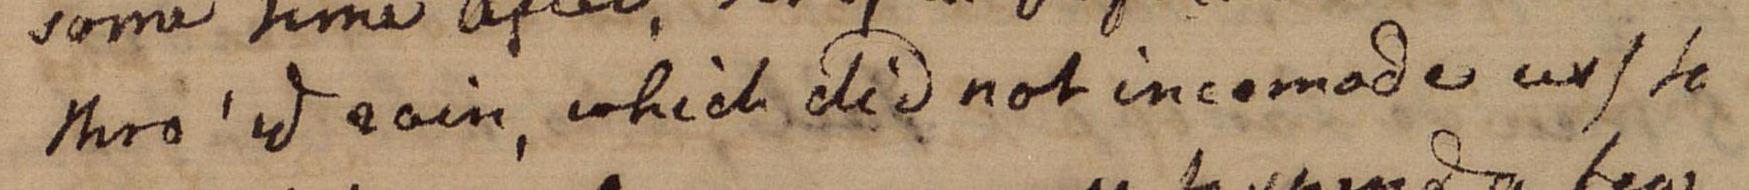thro' y^e rain, which did not incomade with
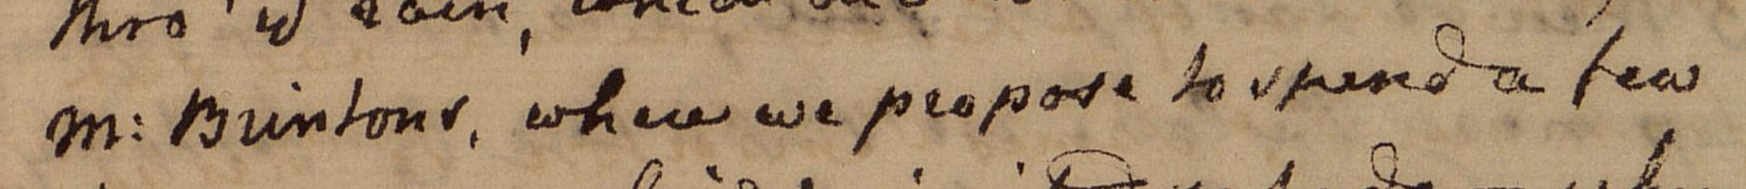M: Brintons, where we propose to spend a few
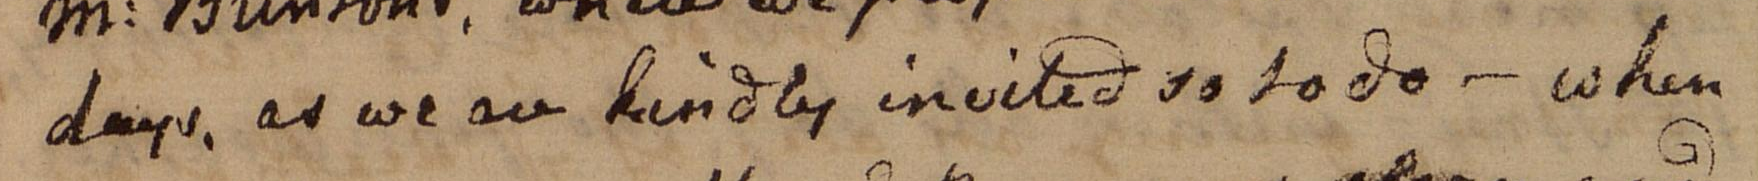days, as we a kindly invited so to do- when
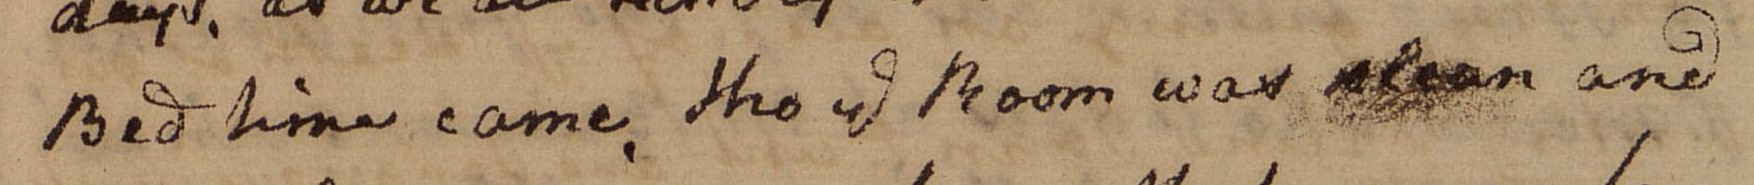Bed time came, tho y^e Room was clean and
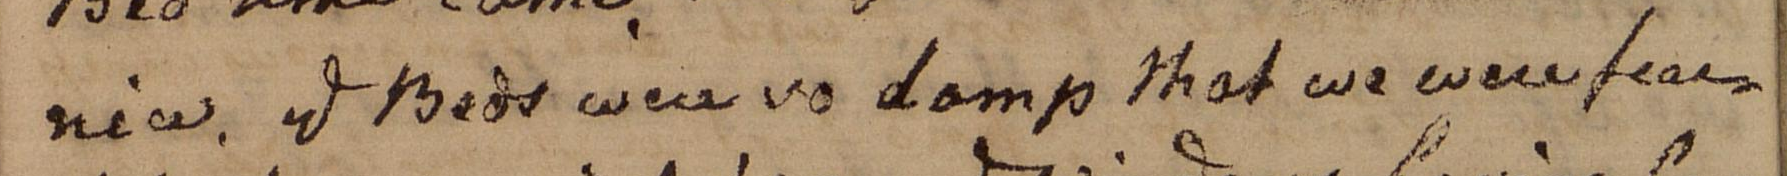nice, y^e Beds were so damp that we were fear-
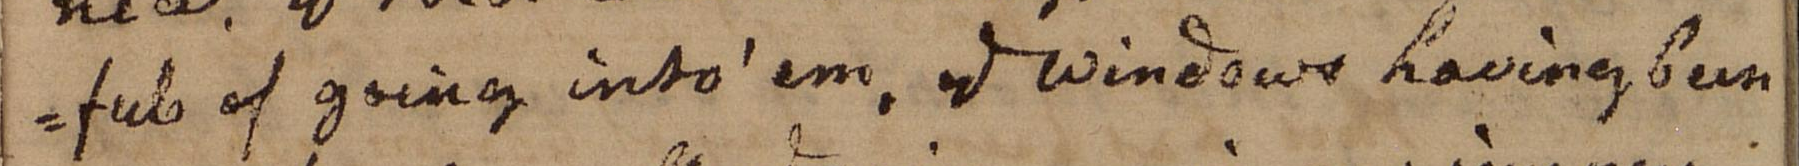-ful of going into 'em, y^e windows having been
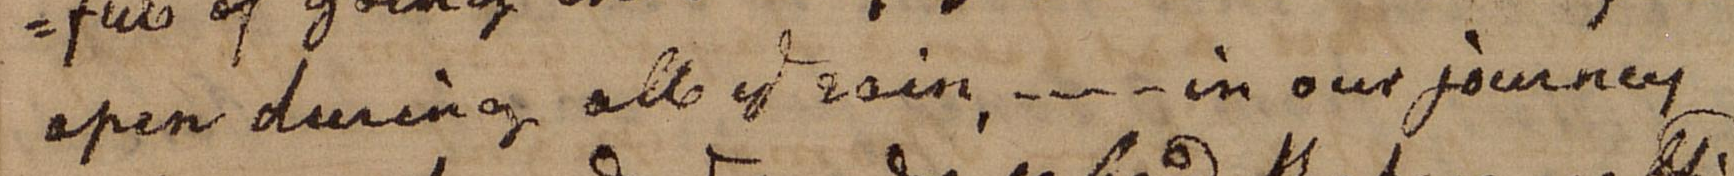open during all y^e rain, -in our journey
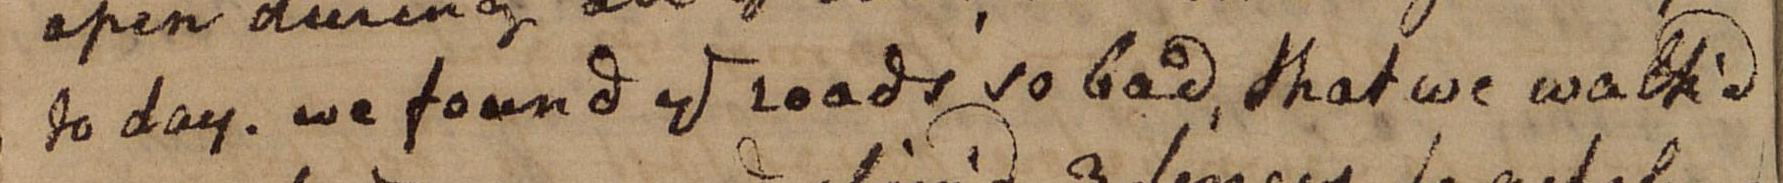to day. we found y^e roads so bad, that we walk'd
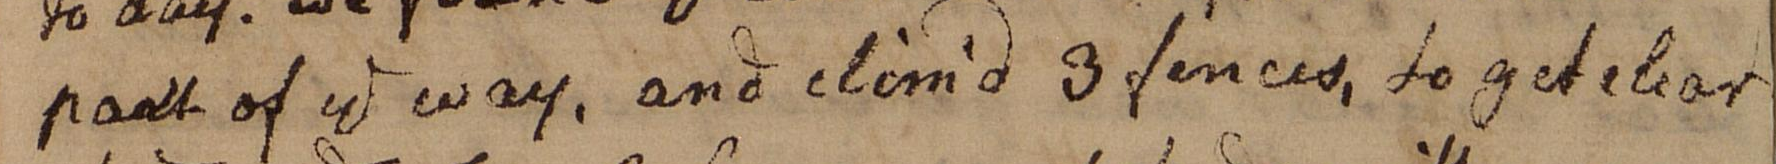part of y^e way, and clim'd 3 fences, to get clear
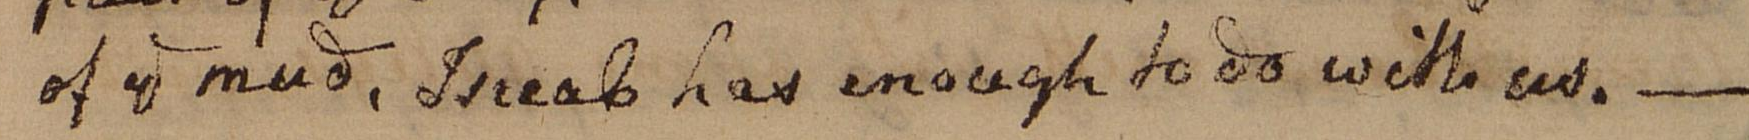of y^e mud, Isreal has enough to do with us.-
